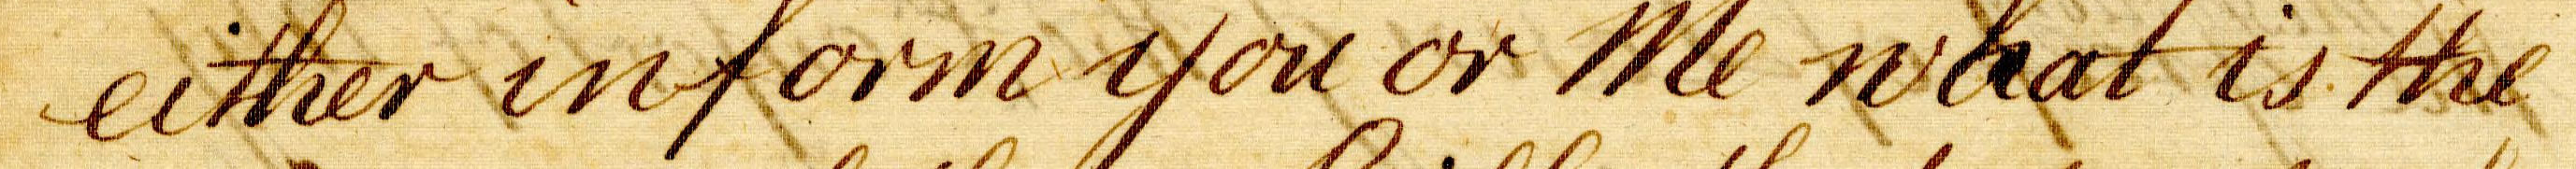either inform you or Me what is the
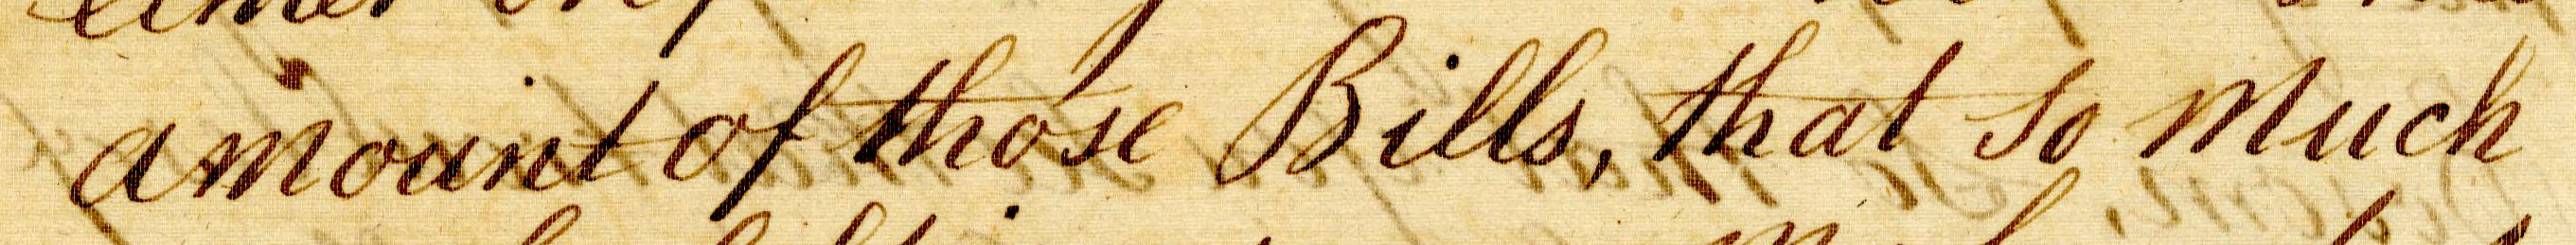amount of those Bills, that so Much
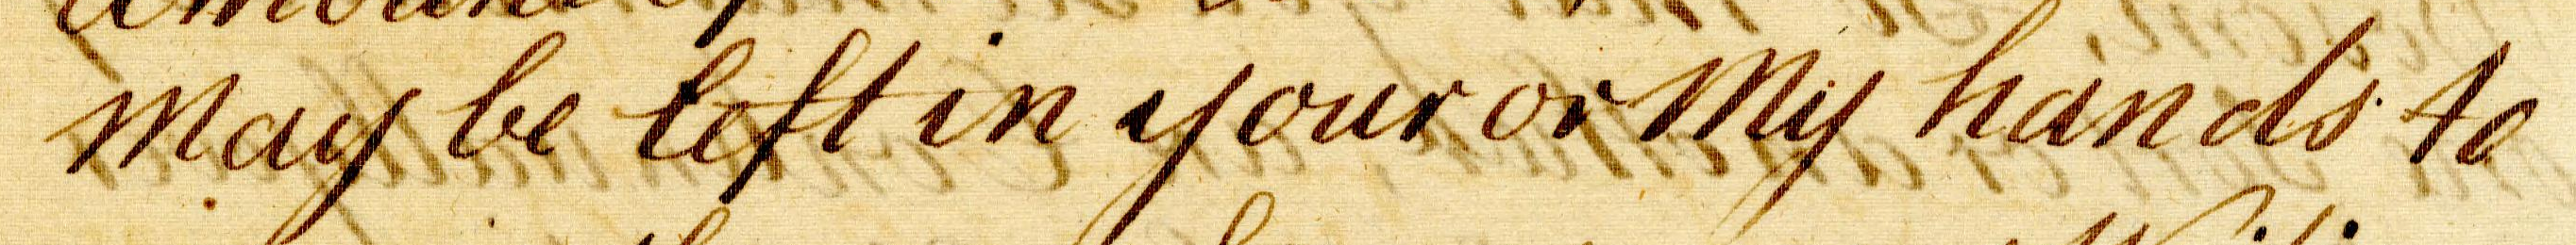May be left in your or My hands to
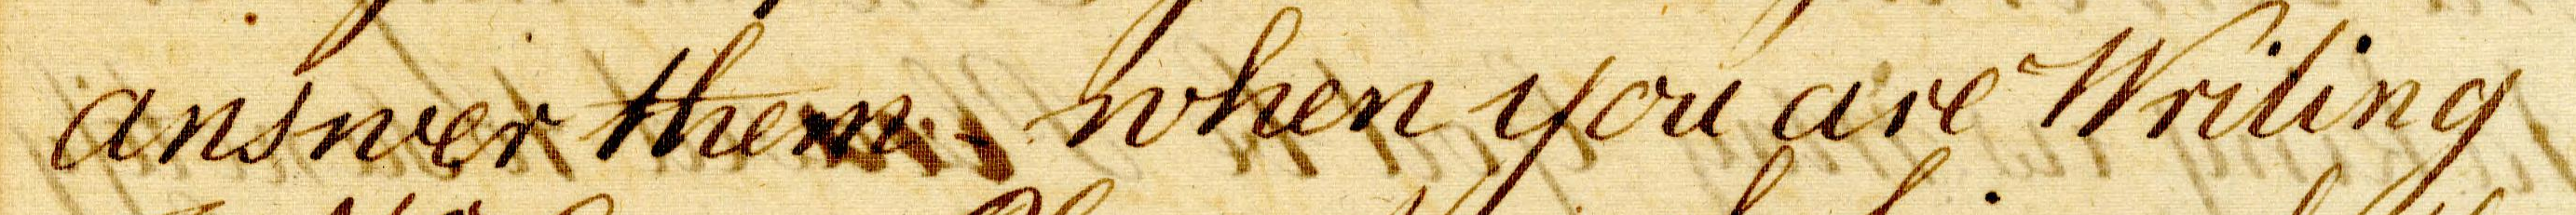Answer them when you are Writing
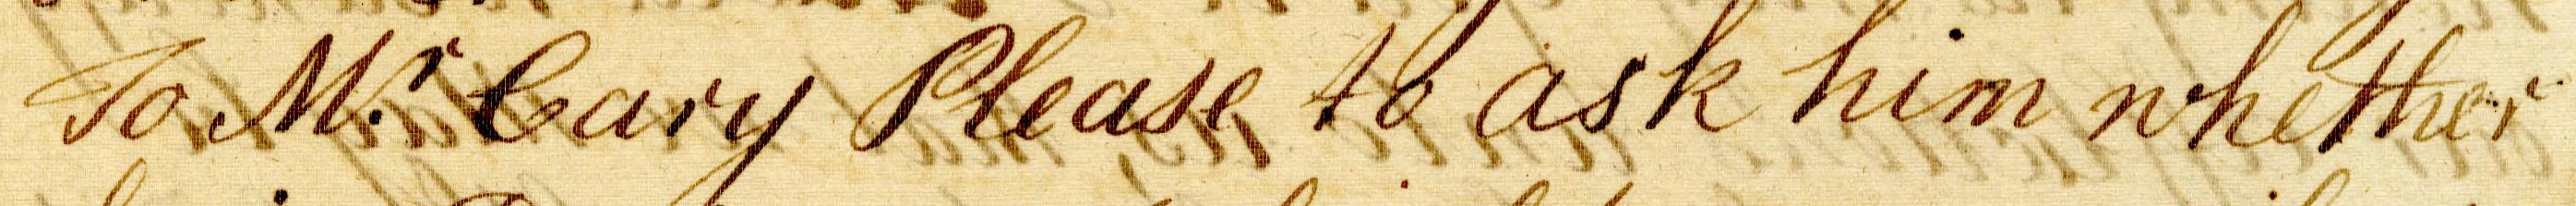To M^r. Cary Please to ask him whether
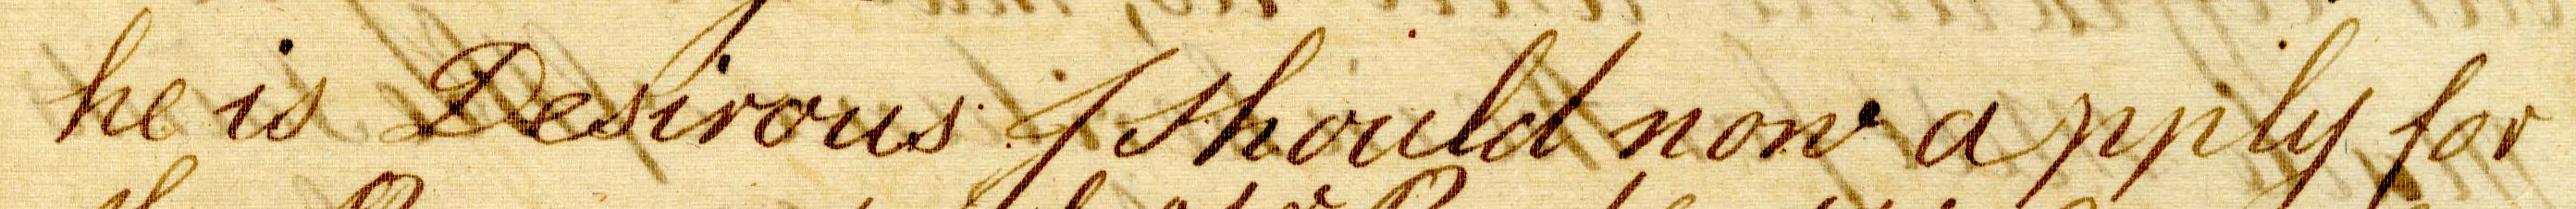he is Desirous I should now apply for
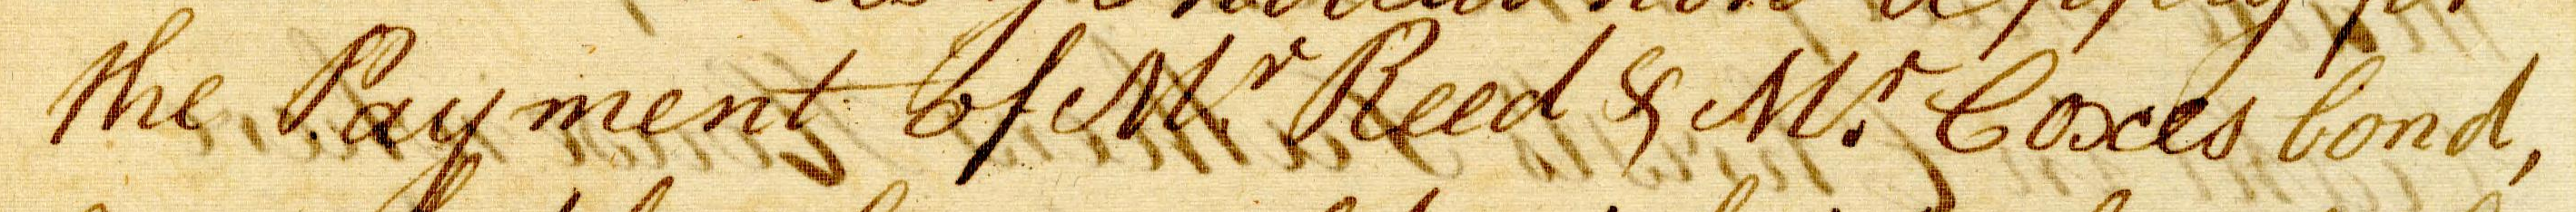the Payment of M^r. Reed & M^r. Coxes bond,
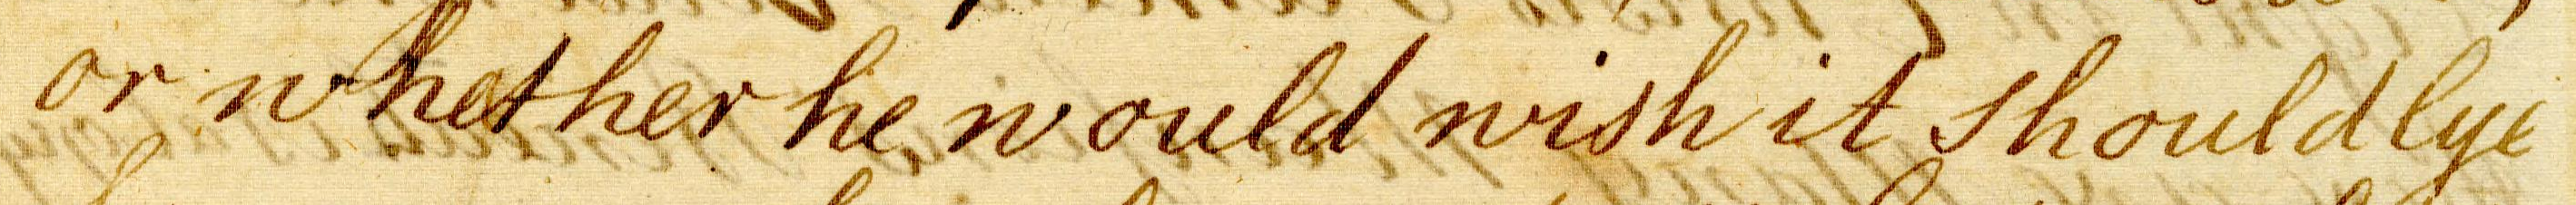or whether he would wish it should lye
